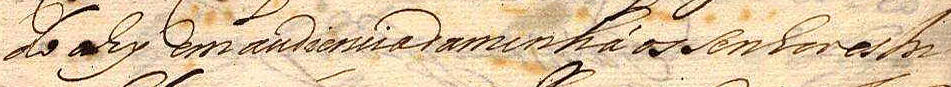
do ahy em audiencia da minhā os senhores In
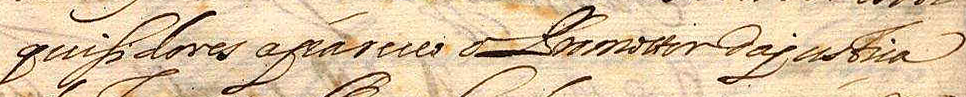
quisidores apareceo o Promottor da justiça
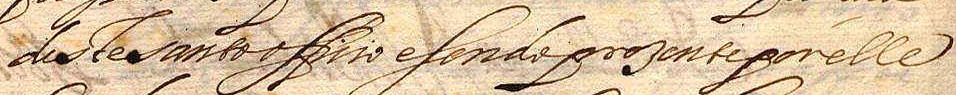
deste santo officio e sendo prezente por elle
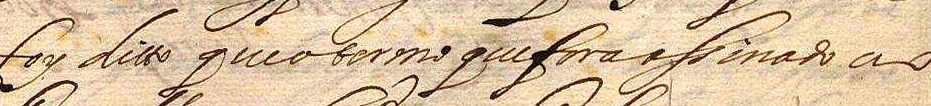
foy ditto que o termo que fora assinado ao
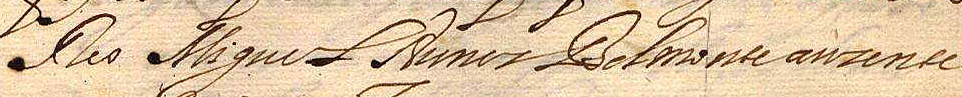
Reo Miguel Nunez Belmonte auzente
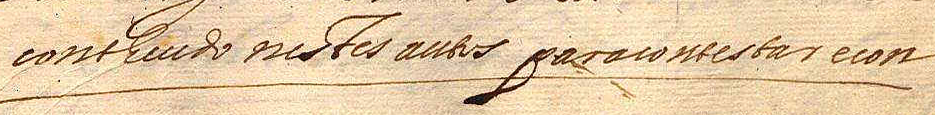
contheudo nestes autos para contestar e con
